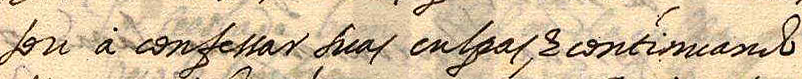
sou a confessar suas culpas, E continuando
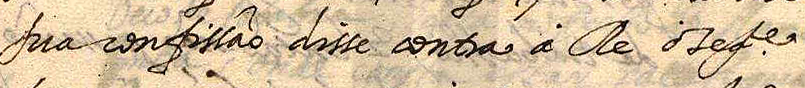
sua confissão disse contra a Re o segt.e
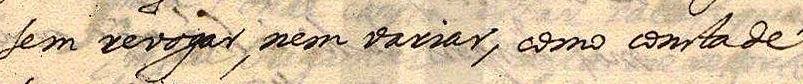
sem revogar, nem variar, como consta de
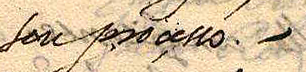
seu processo. –
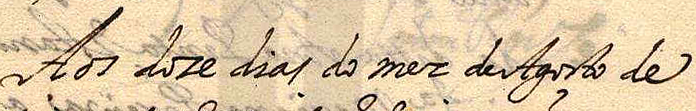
Aos doze dias do mez de Agosto de
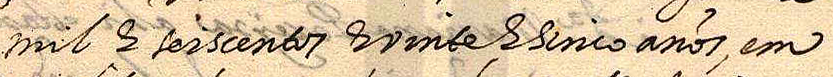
mil E seiscentos E vinte E sinco anōs, em
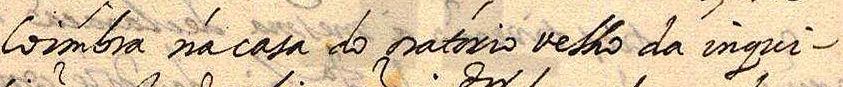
Coimbra na casa do oratorio velho da inqui
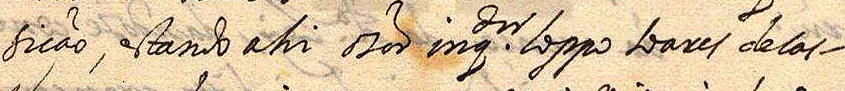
siçaõ, estando ahi o sor̄ inq.dor loppo soares de cas
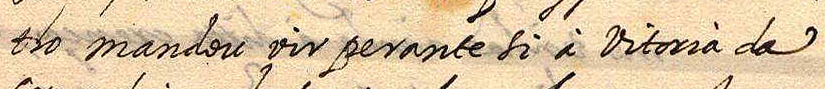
tro mandou vir perante si a Vitoria da
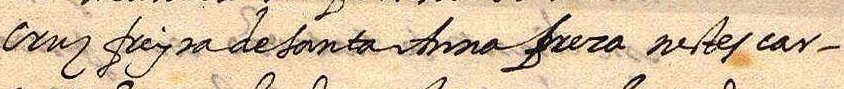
cruz freyra de santa Anna preza nestes car
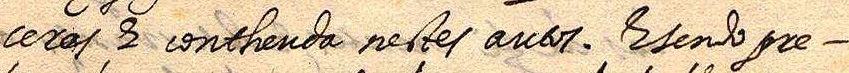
ceres, E contheuda nestes autos. E sendo pre
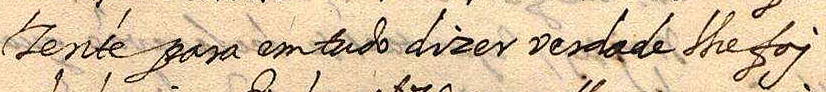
Zente para em tudo dizer verdade lhe foj
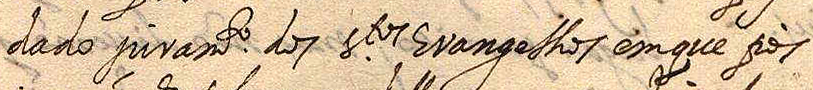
dado juramto. dos s.tos Evangelhos em que pos
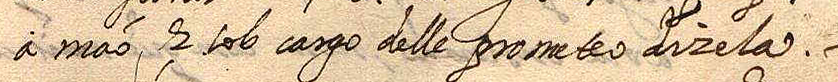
a maõ, E sob cargo delle prometeo dizela. –
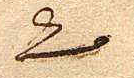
E
